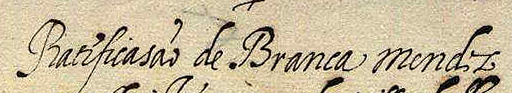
Ratificasão de Branca mendez
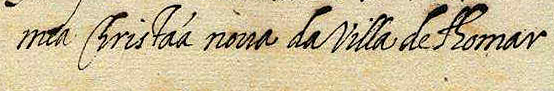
mea Christaā noua da Villa de thomar
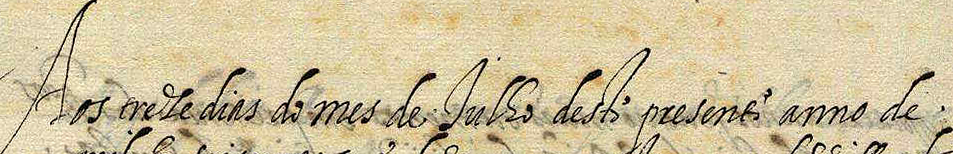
Aos treze dias do mes de Julho deste presente anno de
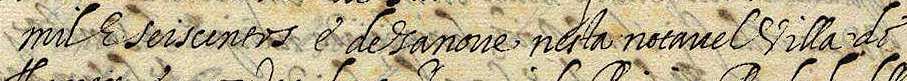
mil E seiscentos e desanoue nesta notauel Villa de
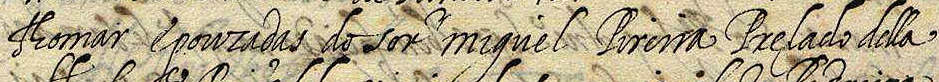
thomar e pouzadas do sor̄ miguel Pireira Prelado della
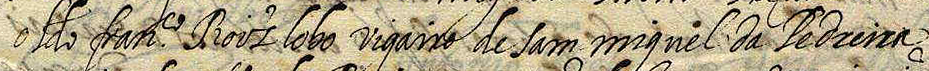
o Ldo fran.co Roiz lobo vigairo de sam miguel da Pedreira
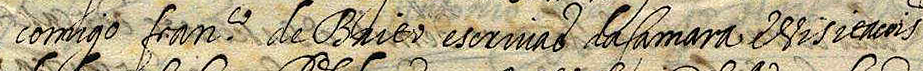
comigo fran.co de Brito escriuaõ da Camara E Visitaçois
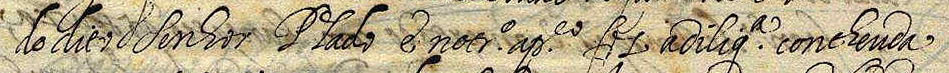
do dito Senhor P̄lado e notr.o ap.co fes a dilig.ca contheuda
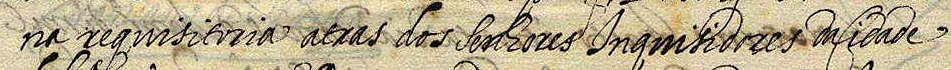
na requisitoria atras dos Senhores Inquisidores da Cidade
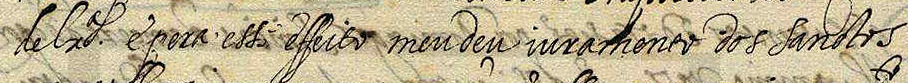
de lx.a e pera esse effeito meu deu iuramento dos sanctos
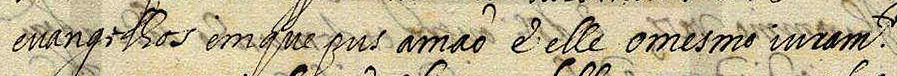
euangelhos em que pus a maõ e elle o mesmo iuram.to
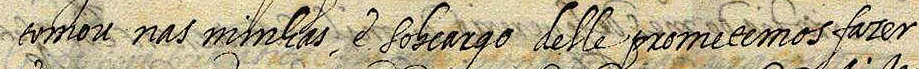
tomou nas minhas, e sob cargo delle prometemos fazer
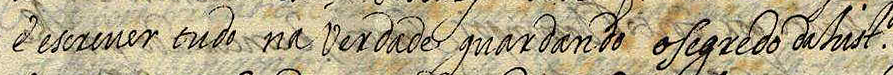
e escreuer tudo na verdade guardando o segredo da Just.a
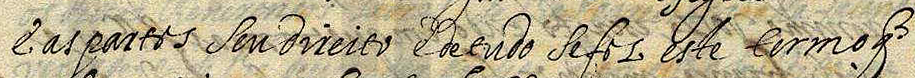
e as partes seu direito e de tudo se fez este termo q̄
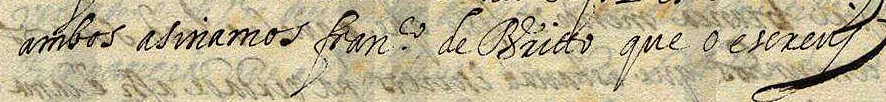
ambos asinamos fran.co de Britto que o escreuj
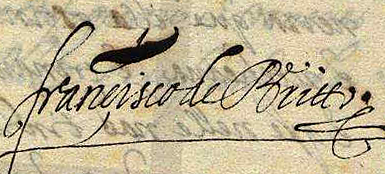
Francisco de Britto
